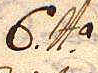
6. tt.a
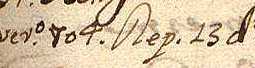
ver.o 704. Rep. 13 d.o
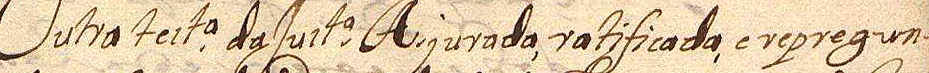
Outra test.a da Just.a A. jurada, ratificada, e repregun
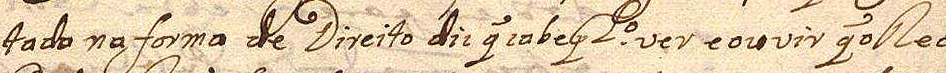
tada na forma de Direito dis q̄ sabe pL.o ver e ouvir q̄ o Reo
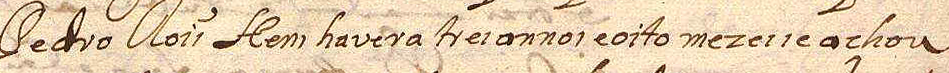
Pedro Rois̄ Hens havera tres annos e oito mezes se achou
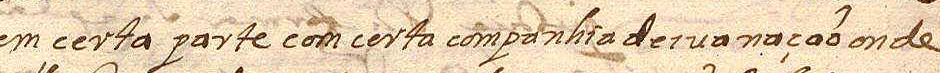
em certa parte com certa companhia de sua naçaõ onde
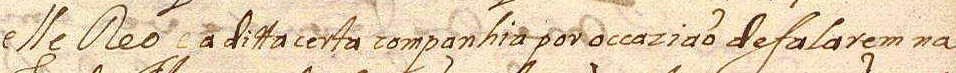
elle Reo e a ditta certa companhia por occaziaõ de falarem na
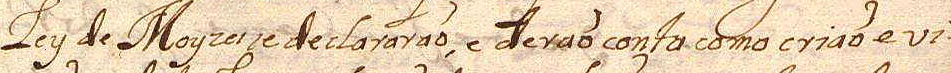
Ley de Moyzes se declararaõ, e deraõ conta como criaõ e vi
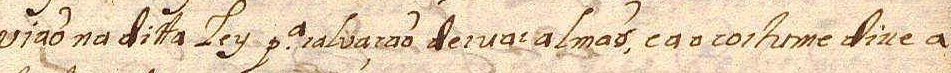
viaõ na ditta Ley p.a salvaçaõ de suas almas, e ao costume disse a
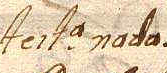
test.a nada.
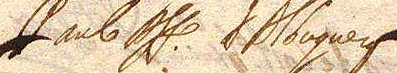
Paulo Aff.o dAlbuquerq̄
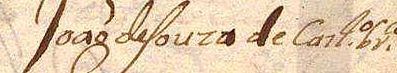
Joaõ de Souza de cast.o br.co
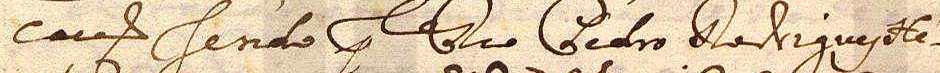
caçaõ sendo plo Reo Pedro Rodrigues Hē
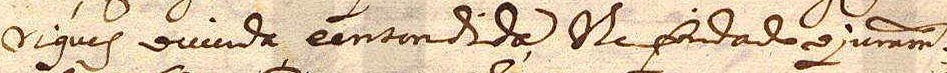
riques ouuida, e entendida, lhe foi dado o juram.to
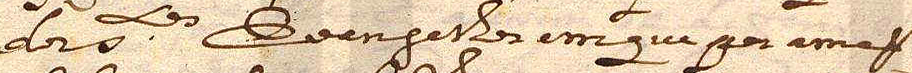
dos s.tos Evangelhos em que poz a maõ
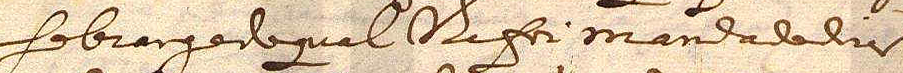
sob cargo do qual lhe foi mandado dizer
